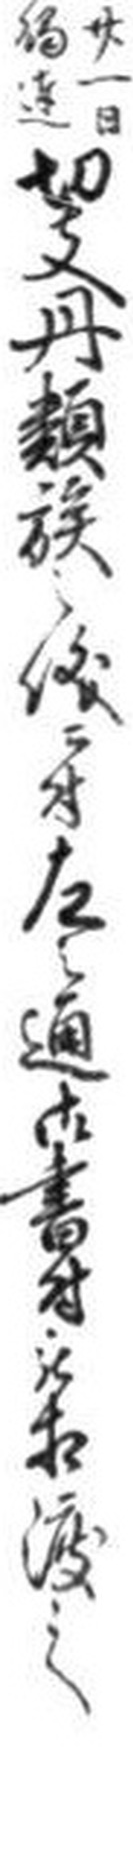御触達切支丹類族之儀ニ付左之通御書付被相渡之
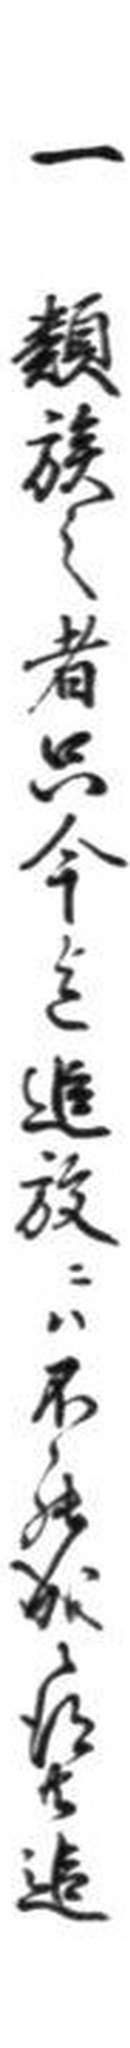一類族之者只今迄追放ニハ不罷成候得共追
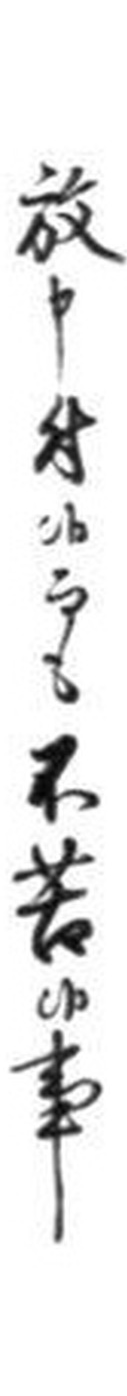放申付候而も不苦候事
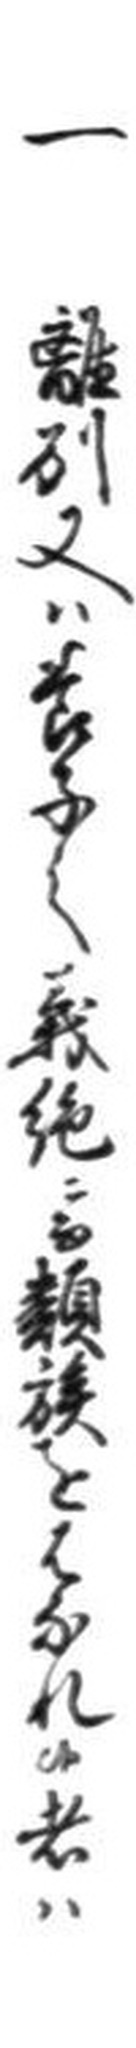一離別又ハ養子之義絶ニ而類族をはなれ候者ハ
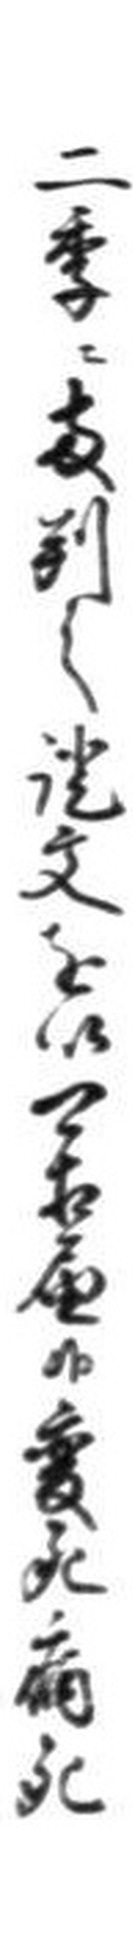二季ニ両判之証文を以可相届候変死病死
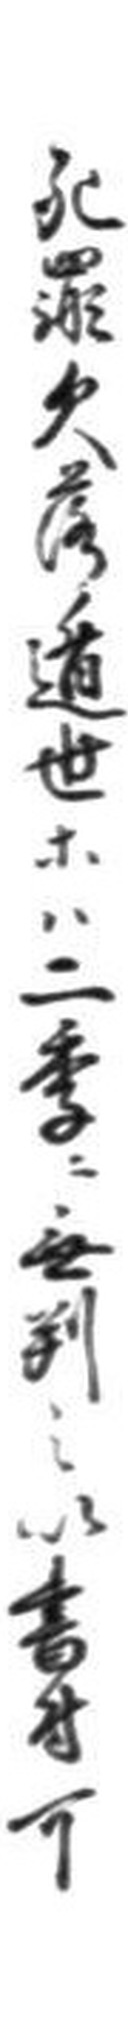死罪欠落遁世等ハ二季ニ無判之以書付可
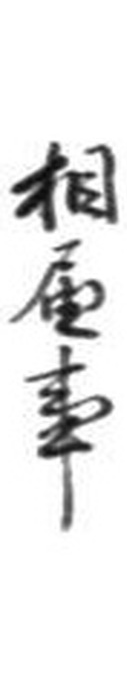相届事
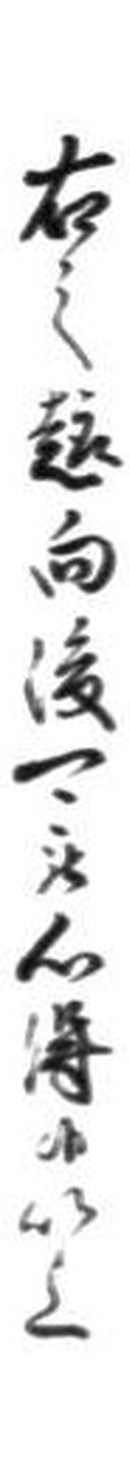右之趣向後可被心得候以上
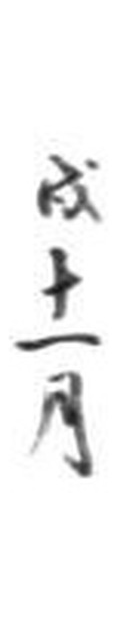戌十一月
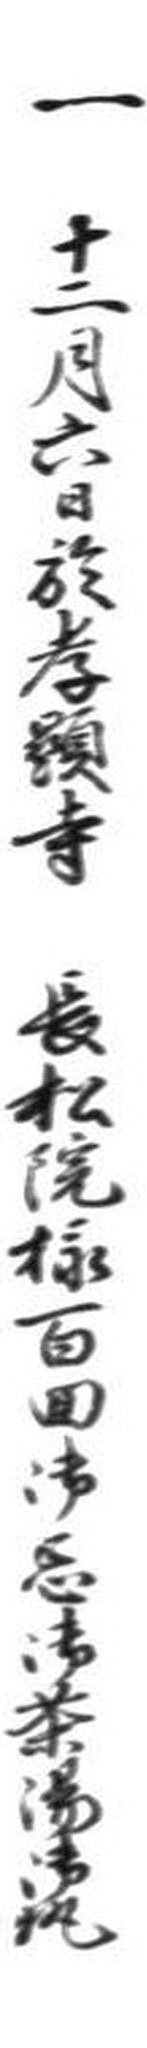一十二月六日於孝顕寺長松院様百回御忌御茶湯御執
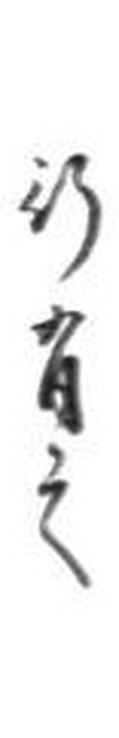行有之

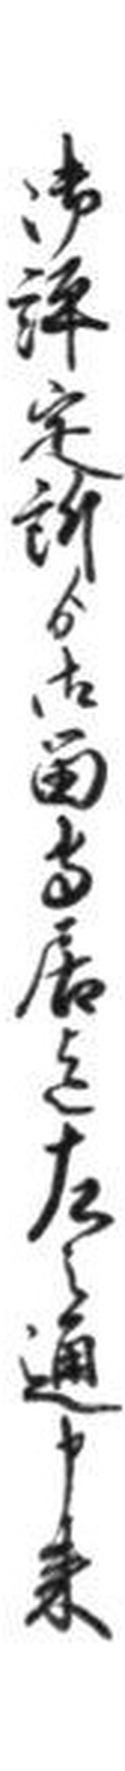御評定所ゟ御留守居迄左之通申来
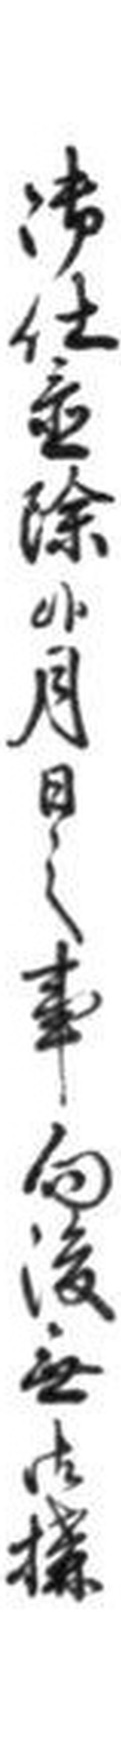御仕置除候月日之事向後無御構
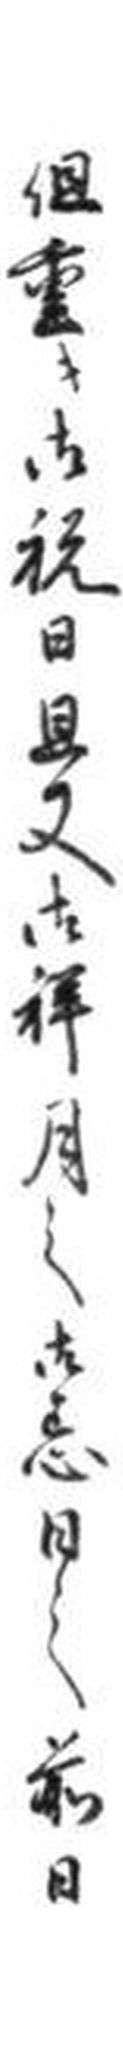但重キ御祝日且又御祥月之御忌日之前日
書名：家譜 三十二 吉邦公 従享保二年到享保三年
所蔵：福井県文書館 Fukui Prefectural Archives
